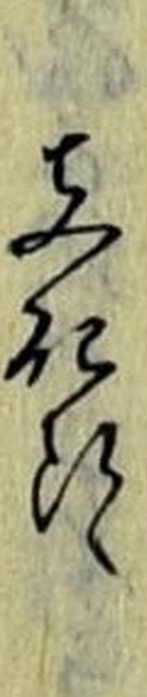支配頭へ
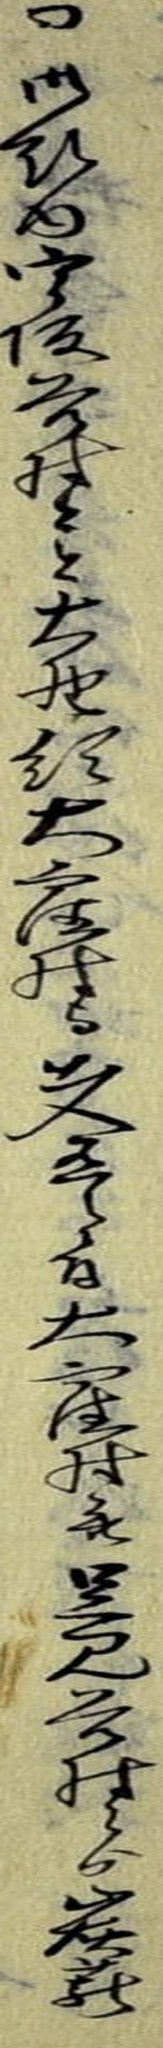〇御領内宇坂谷村々と大野領大窪村と出入有之に付大窪村并足見谷村々ゟ炭薪
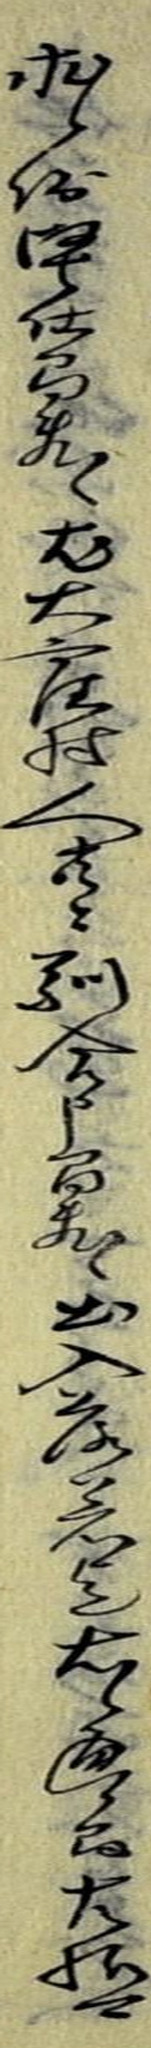求候儀堅仕間敷候尤大窪村人共と馴合申間敷候出入落着迄右之通候間左様可
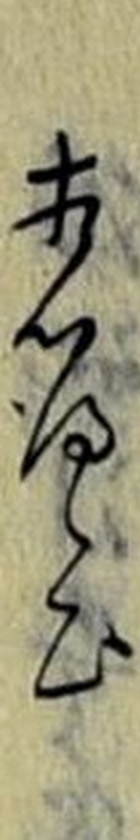相心得候以上
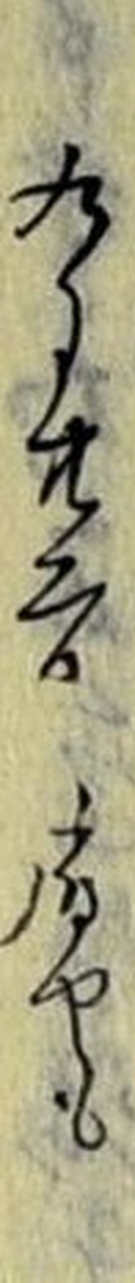九月廿二日府中へも
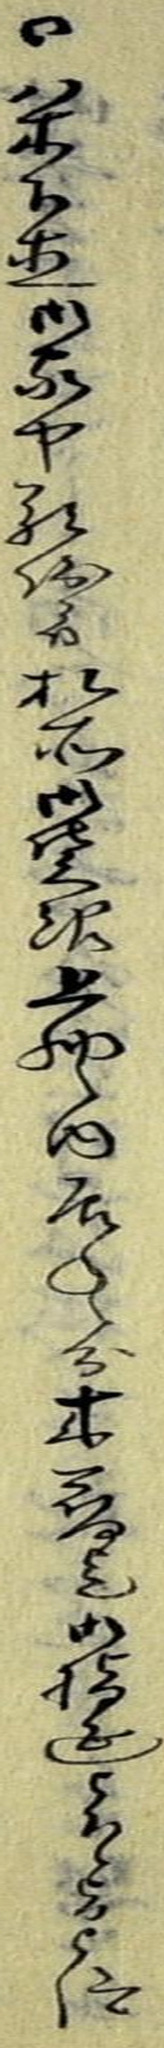〇米下直御家中難儀に付札所御貸銀上納之内辰年之分来暮迄御指延被下候旨被仰
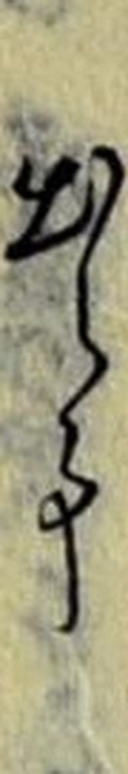出之事
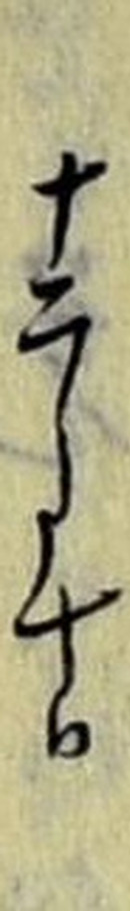十二月十日

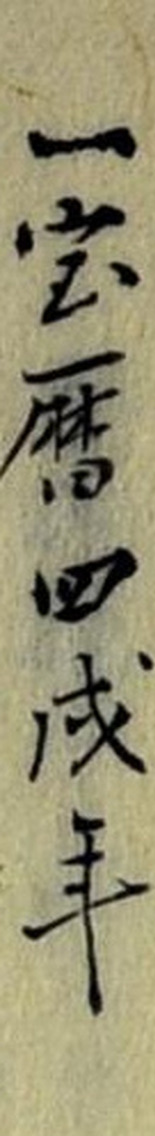一宝暦四戌年
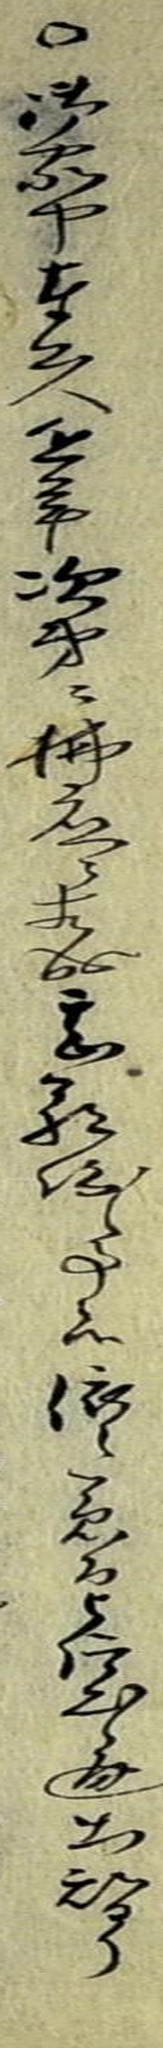〇御家中奉公人近年次第に払底に相成甚難儀之事に候依之兼而被仰出候通出替り
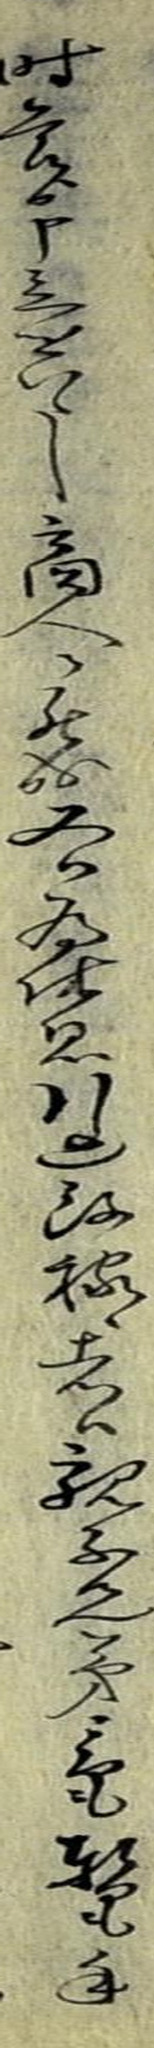時節ゟ申立をいたし商人に罷成又は為休息引込致稼候者は親子兄弟に而も暫も手
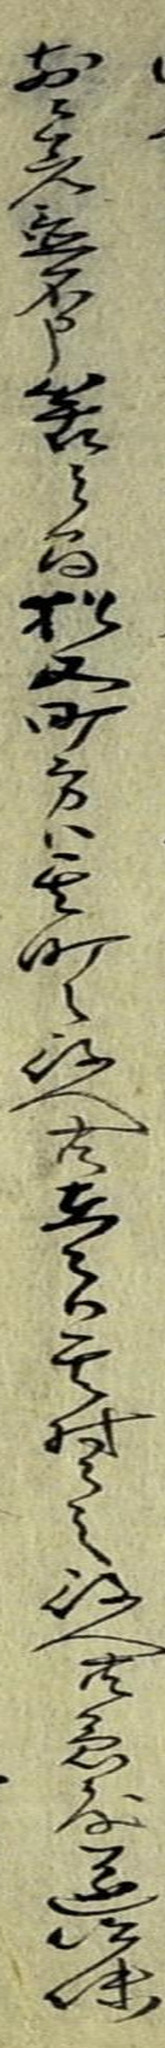前に差置不申筈に候間猶又町方は其町之役人共在々は其村々之役人共急度遂吟味
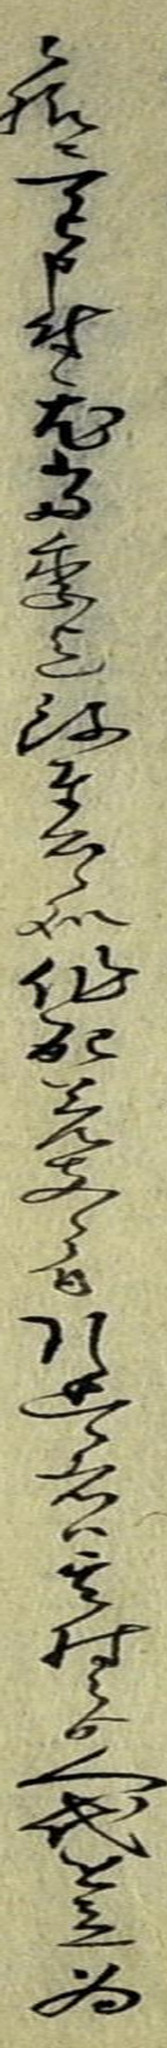候様に可被申付候尤当季迄致奉公候処作配差支候に付引込候者は其村々ゟ人代を立為
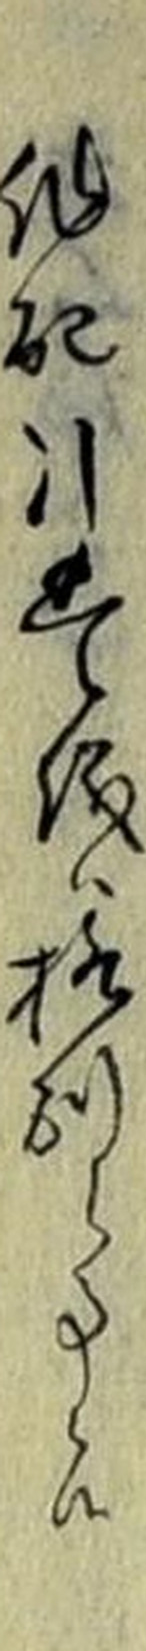作配引込候儀は格別之事に候
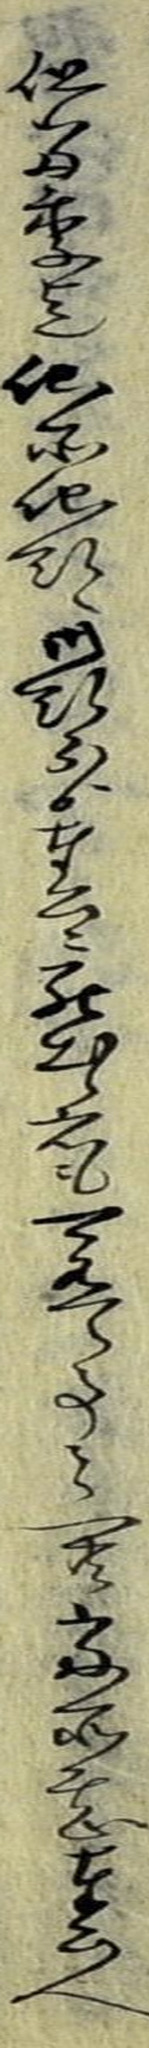但当季迄他所他領へ御領分ゟ奉公に罷出候者も可有之事に候へ共当所甚奉公人
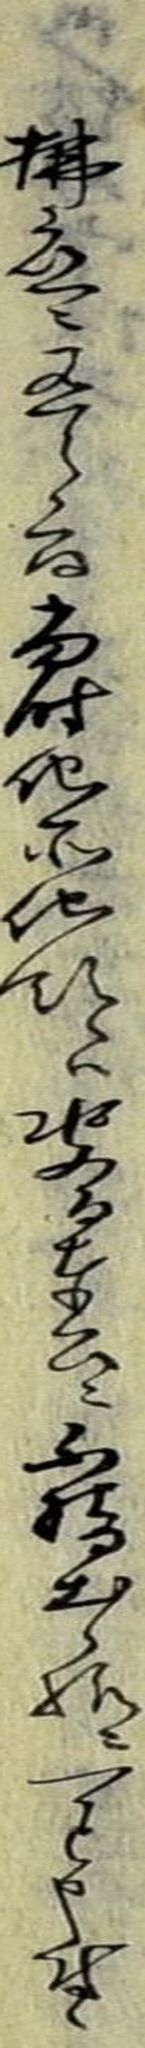払底に有之候間当時他所他領へは決而奉公に不指出候様に可被申付候
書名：命令之部 二
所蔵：福井県文書館 Fukui Prefectural Archives
